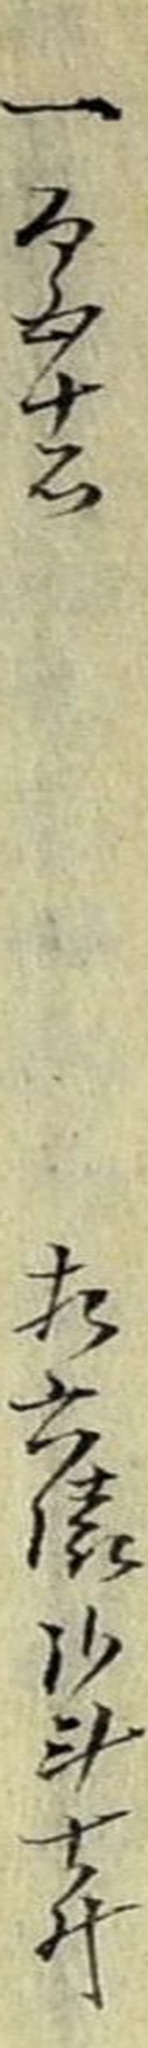一百五十石拾六俵弐斗七升
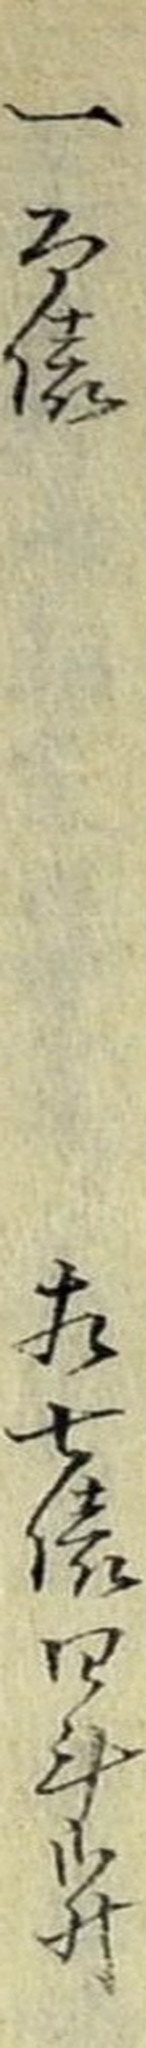一百俵拾七俵四斗弐升
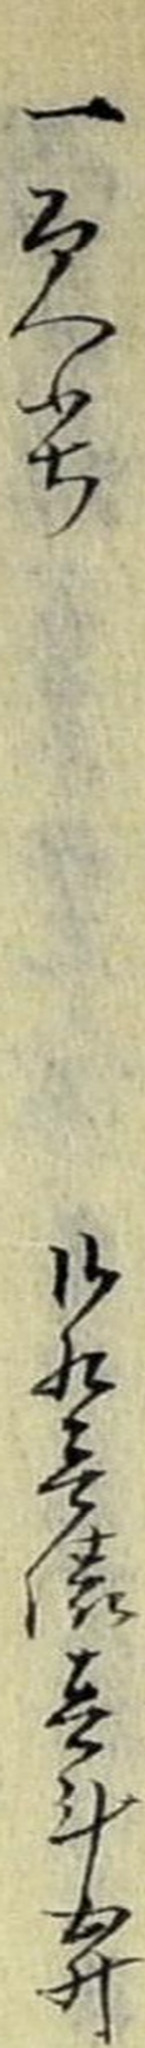一百人ふち弐拾壱俵壱斗五升
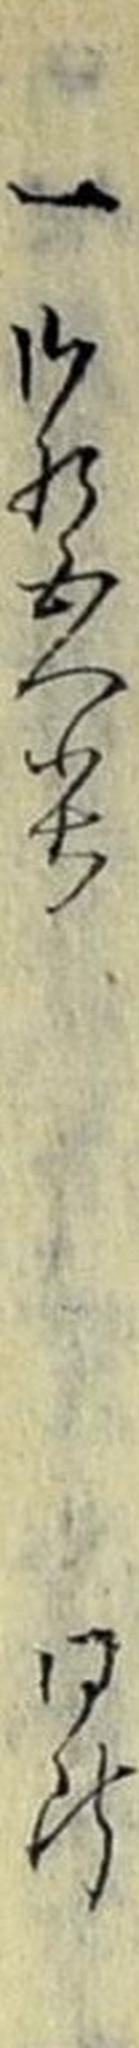一弐拾五人ふち同断
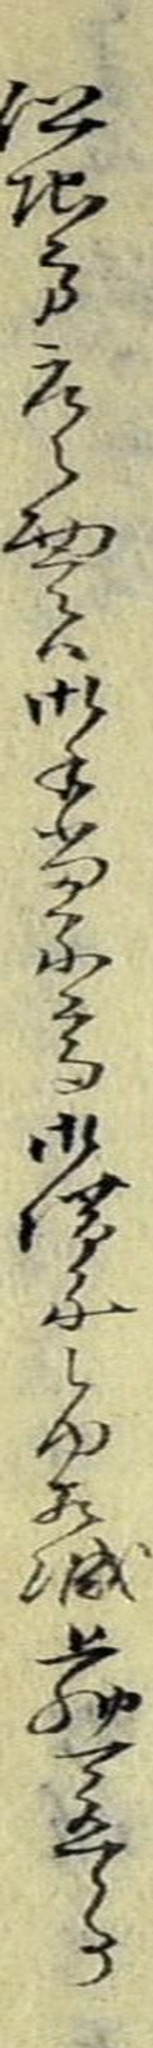但地方取之面々は御手当米高御借米之内相減上納可有之事

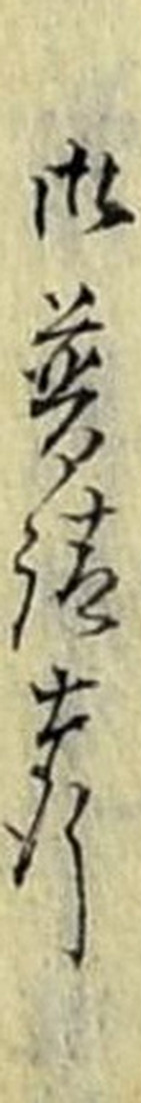御普請奉行
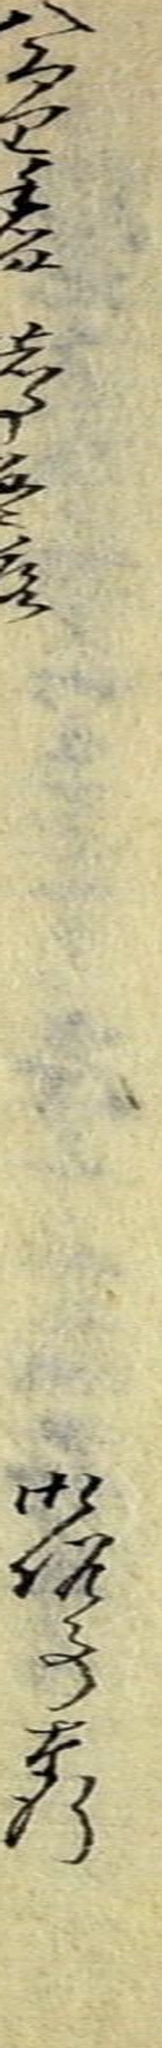八百里手留諸事留に落御作事奉行
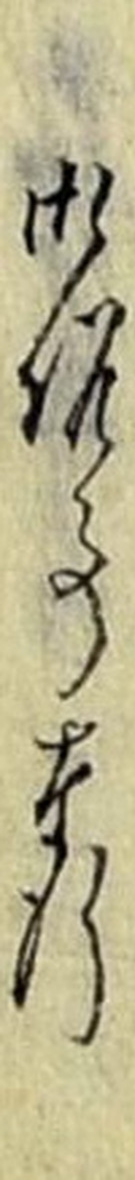御普請奉行
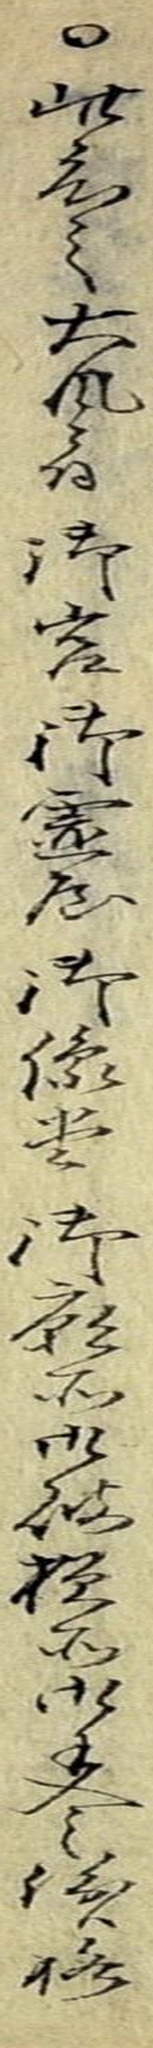○此度之大風に付御宮御霊屋御像堂御廟所御破損所御手入之儀は格
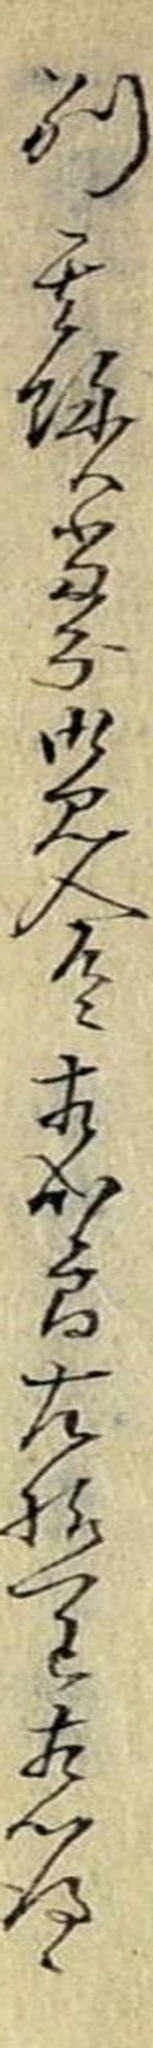別其餘は当分御見合に相成候間左様可被相心得候
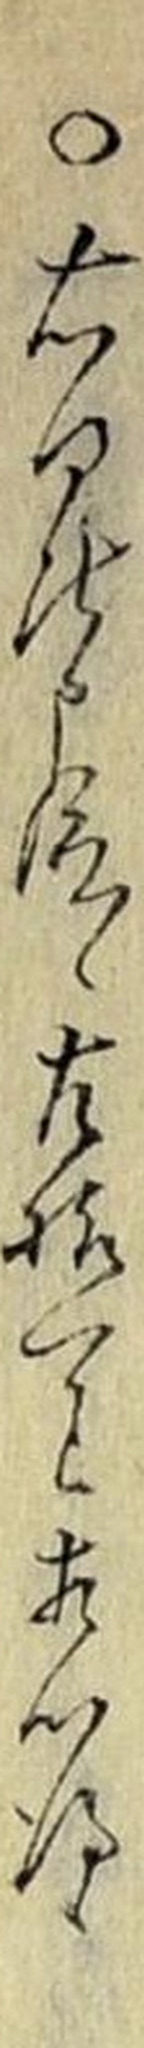○右同断申渡候左様可被相心得候
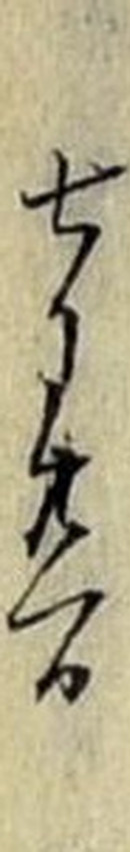七月廿一日
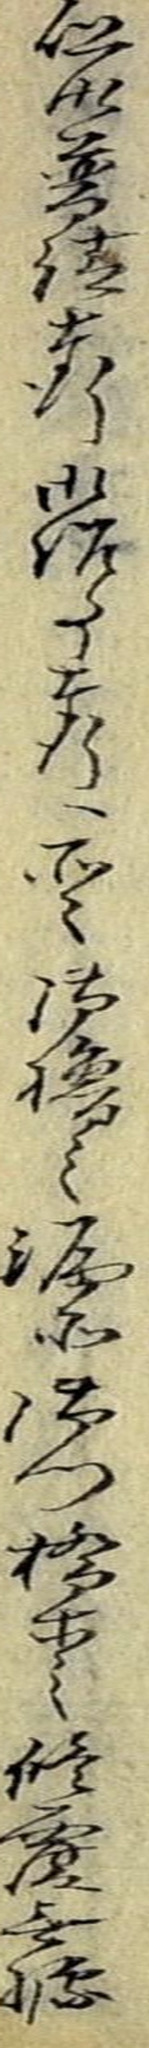但御普請奉行御作事奉行へ所々御櫓之痛所御門橋等之修覆無拠
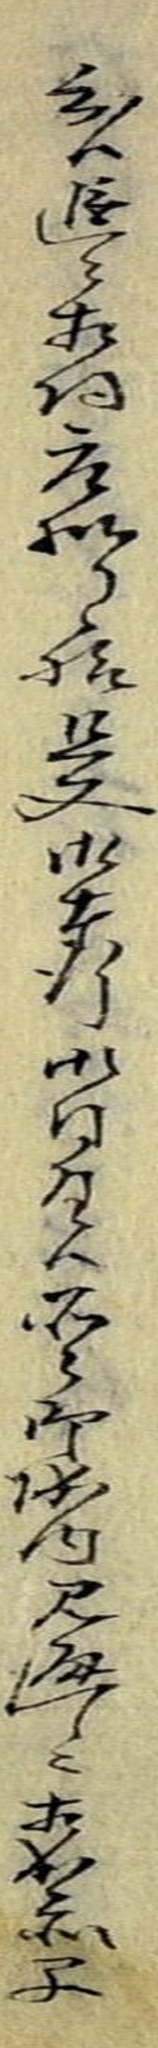分は追々相伺取掛り候様且又御奉行御目付は所々御城内見通に相成所早
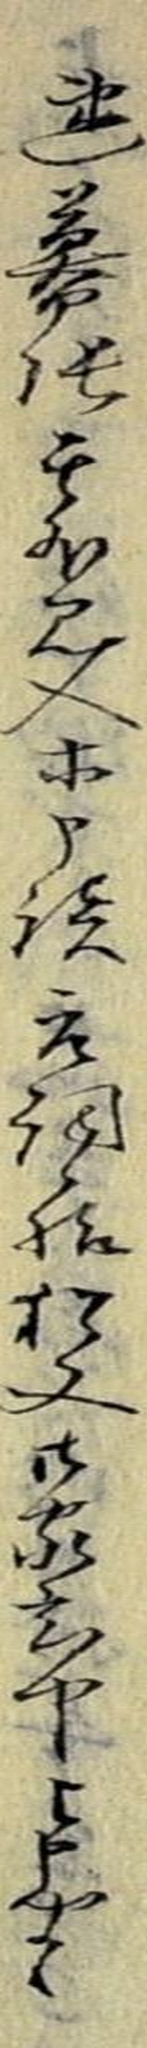速幕張其外見入等申談取調候様猶又御家老中被申聞候
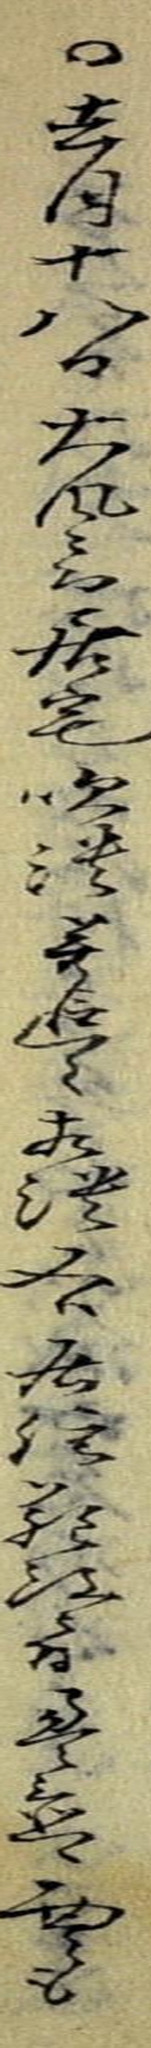○去月十八日大風に而居宅吹潰并追々相潰又は居住難致に付畳置候面々も
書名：命令之部 六
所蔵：福井県文書館 Fukui Prefectural Archives
